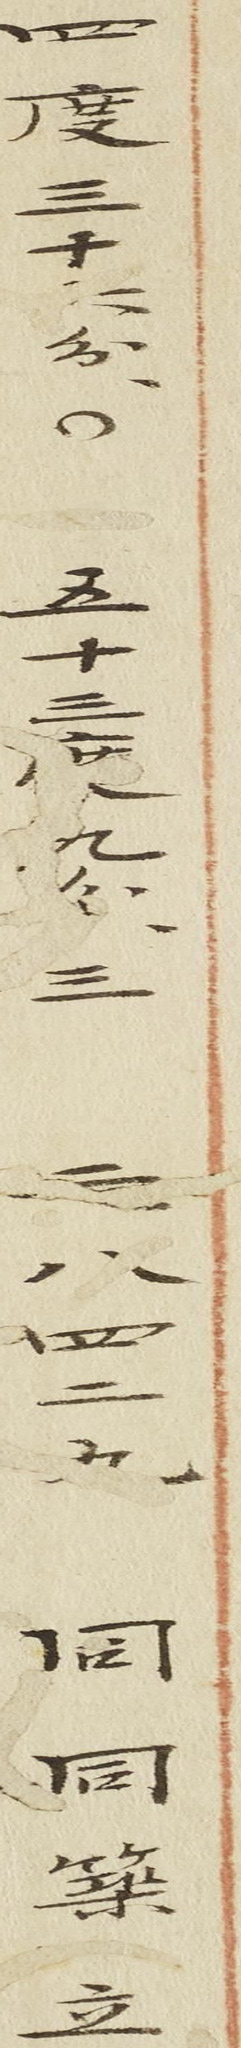四度三十六分、〇五十三度九分、三二、八四二九同同築立
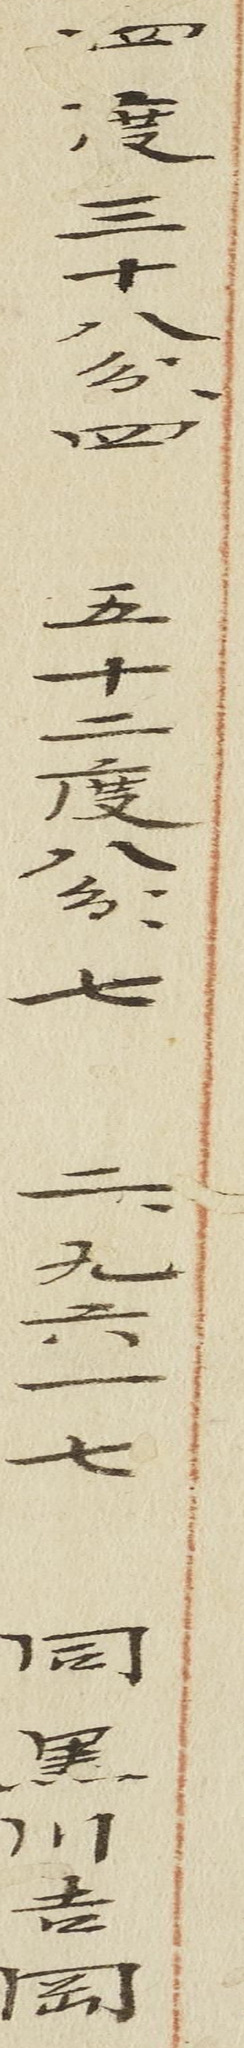四度三十八分、四五十二度八分、七二、九六一七同黒川吉岡
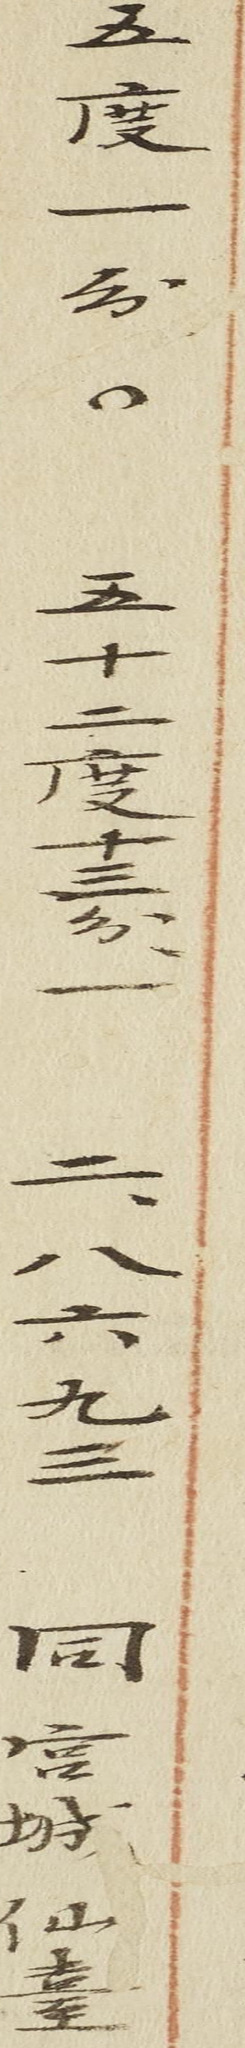五度一分、〇五十二度十三分、一二、八六九三同宮城仙台
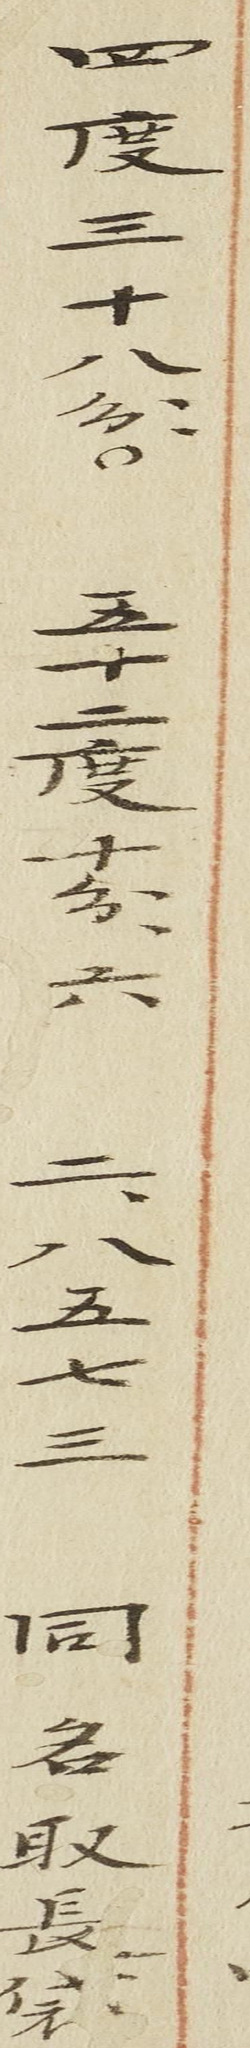四度三十八分、〇五十二度十分、六二、八五七三同名取長袋
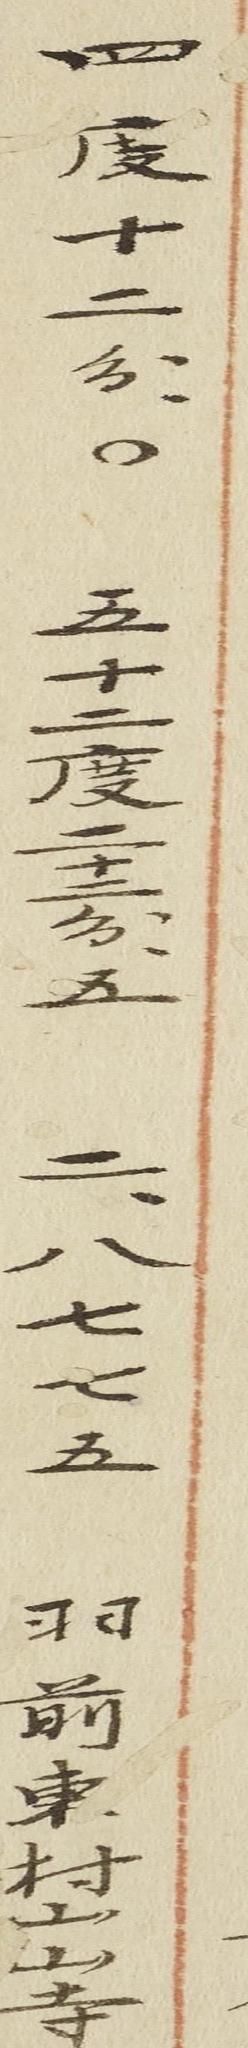四度十二分、〇五十二度二十二分、五二、八七七五羽前東村山山寺
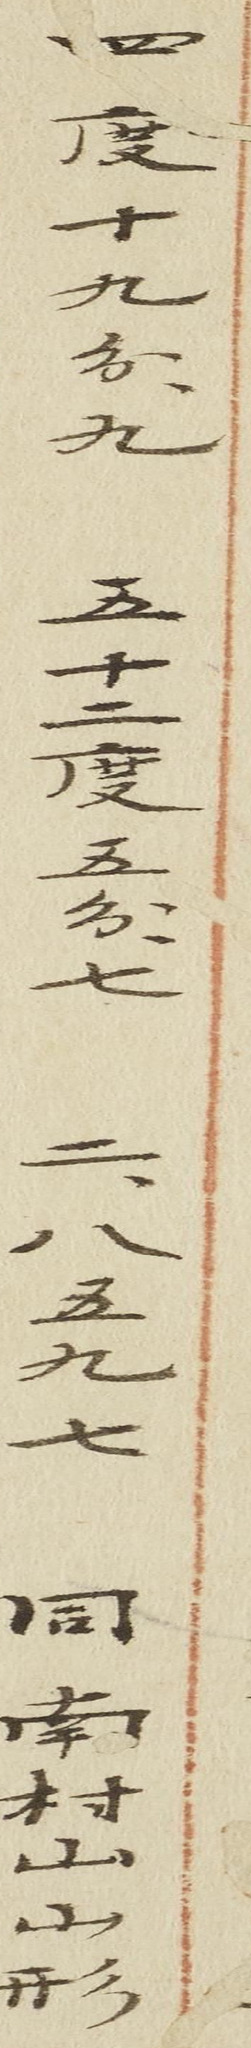四度十九分、九五十二度五分、七二、八五九七同南村山山形
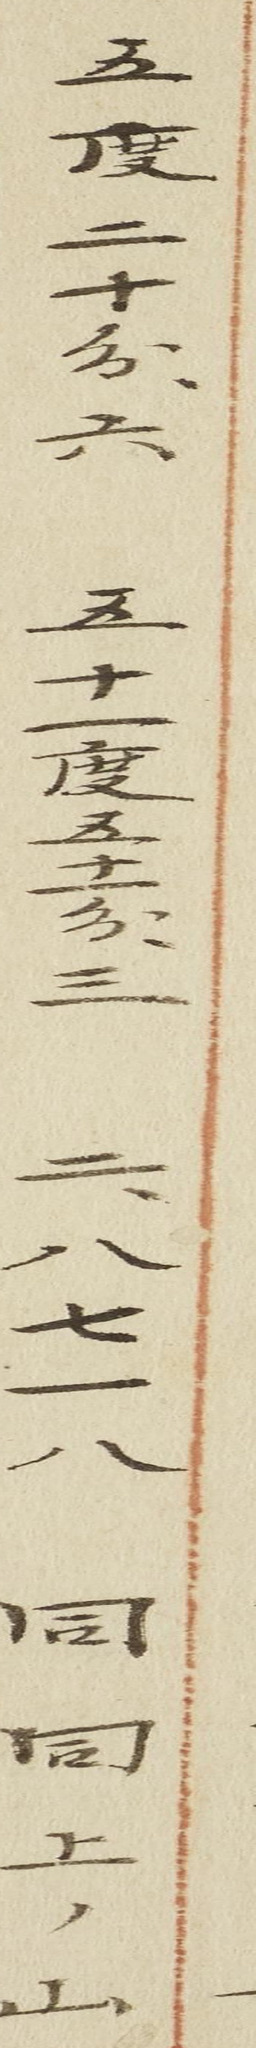五度二十分、六五十一度五十一分、三二、八七一八同同上ノ山
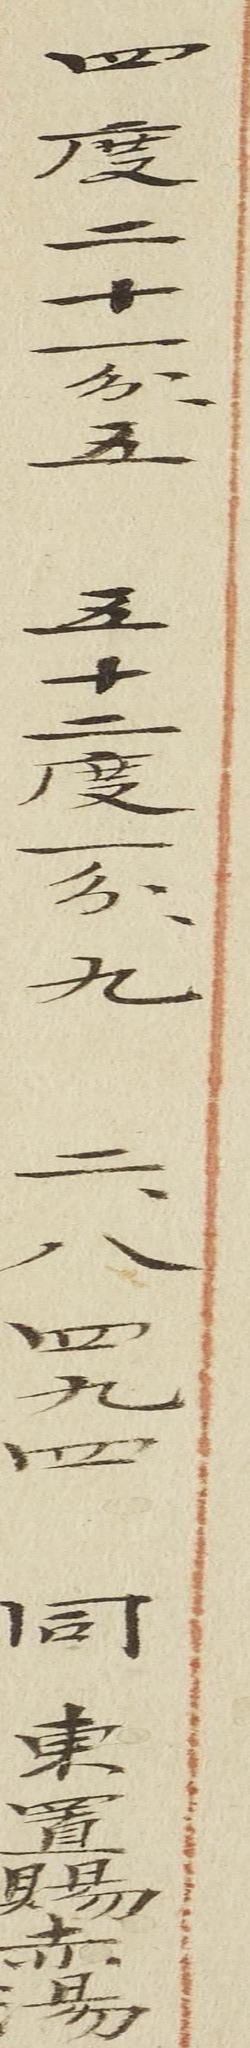四度二十一分、五五十二度一分、九二、八四九四同東置賜赤湯
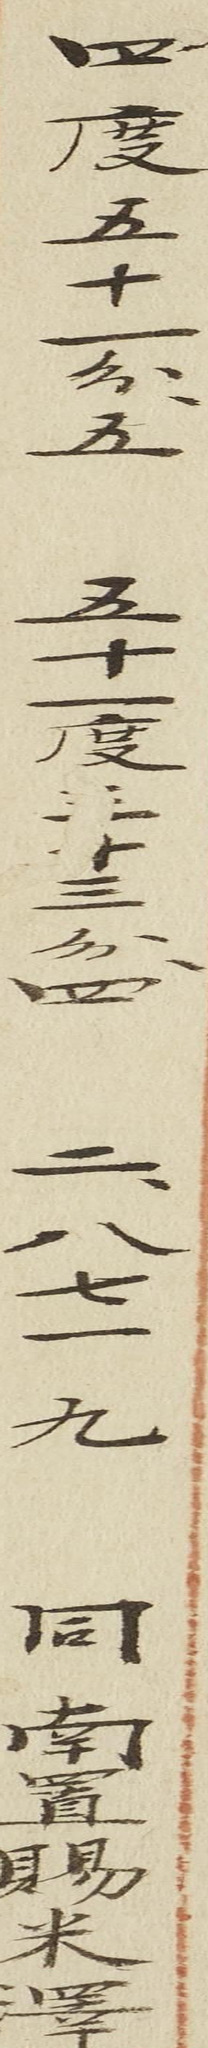四度五十一分、五五十一度三十三分、四二、八七一九同南置賜米沢
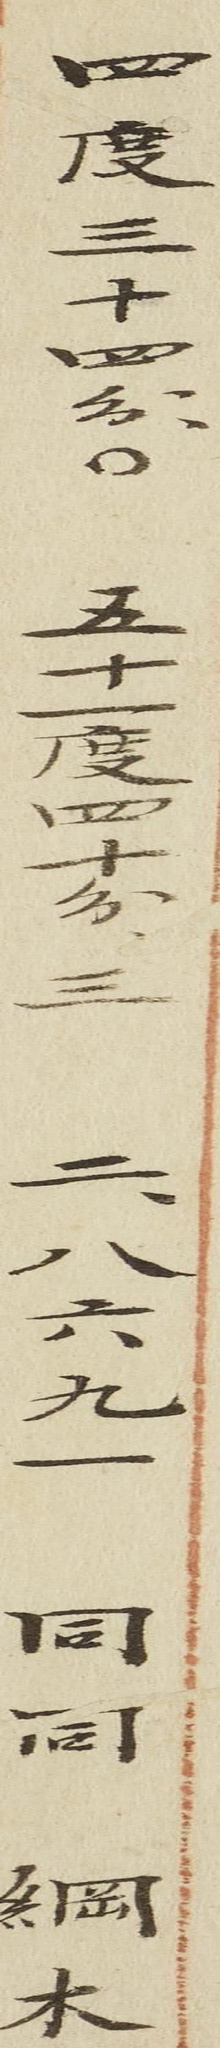四度三十四分、〇五十一度四十分、三二、八六九一同同網木
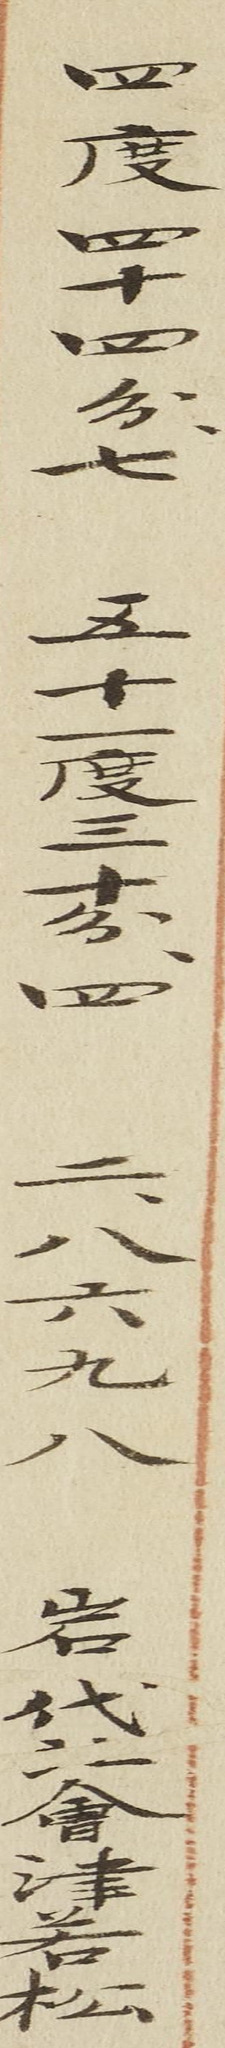四度四十四分、七五十一度三十分、四二、八六九八岩代北会津若松
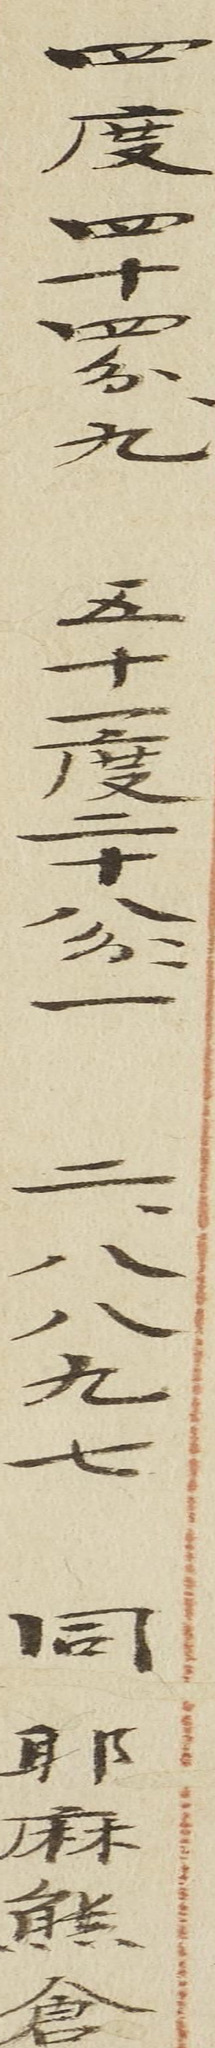四度四十四分、九五十一度二十八分、一二、八八九七同耶麻熊倉
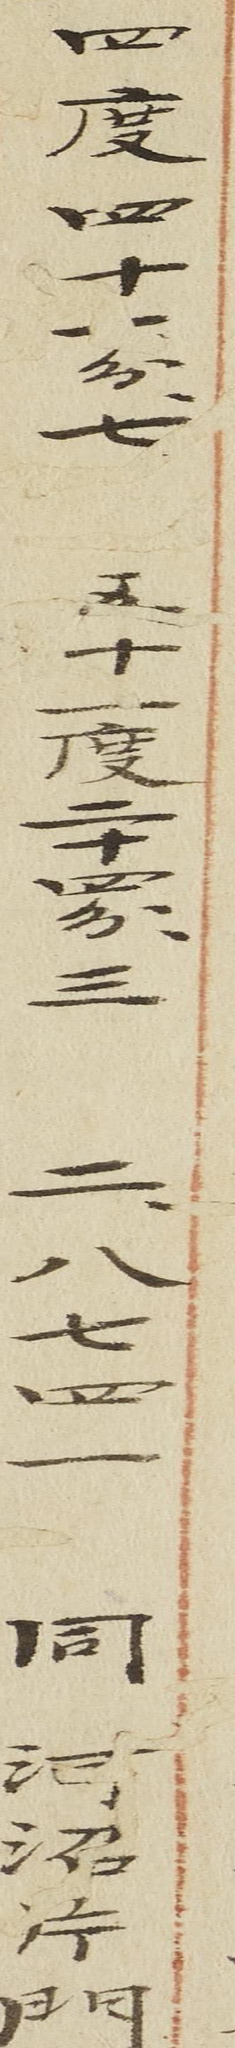四度四十一分、七五十一度二十四分、三二、八七四一同河沼片門

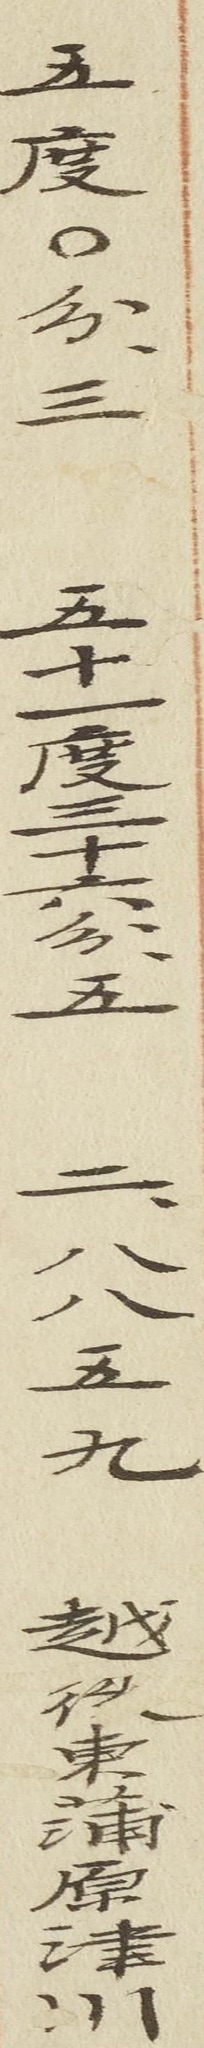五度〇分、三五十一度三十六分、五二、八八五九越後東蒲原津川
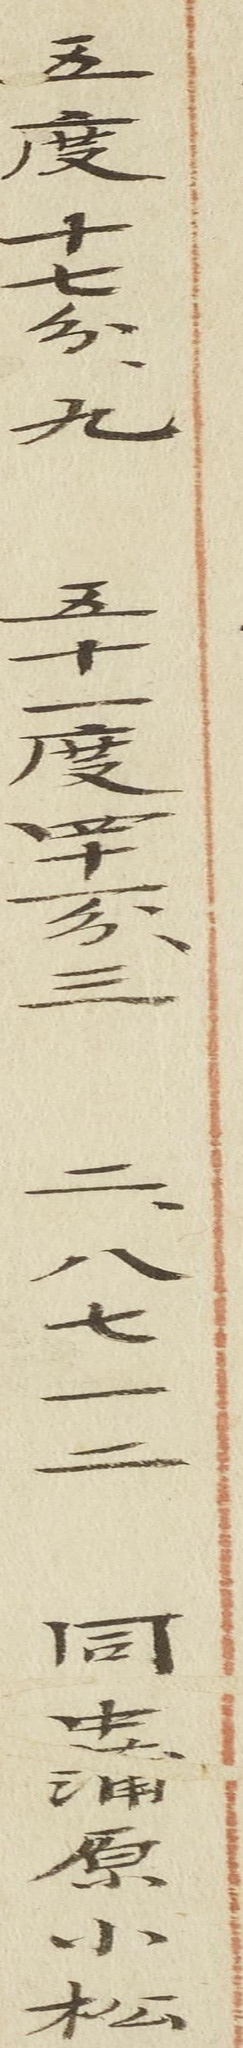五度十七分、九五十一度四十一分、三二、八七一二同中蒲原小松
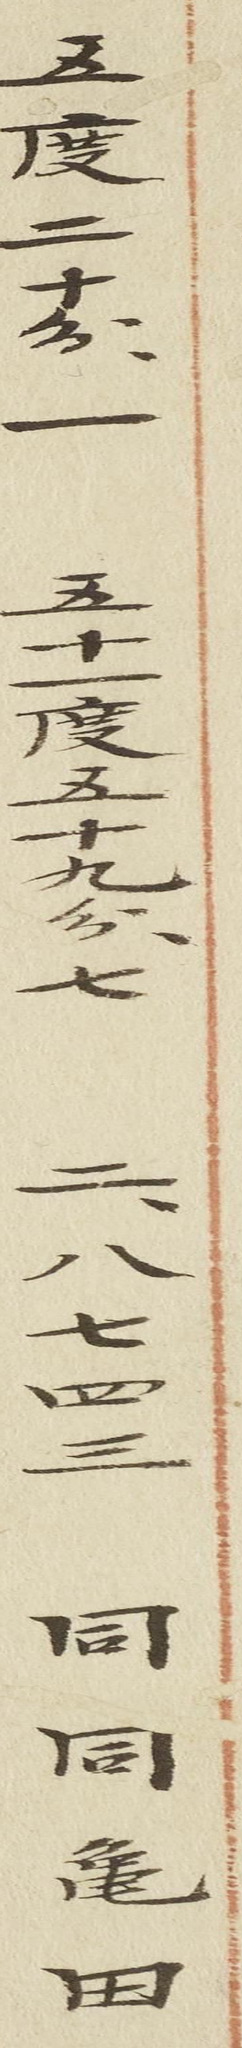五度二十分、一五十一度五十九分、七二、八七四三同同亀田
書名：鑷力観測報告
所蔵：東京大学地震研究所図書室 Earthquake Research Institute Library, The University of Tokyo, JAPAN
